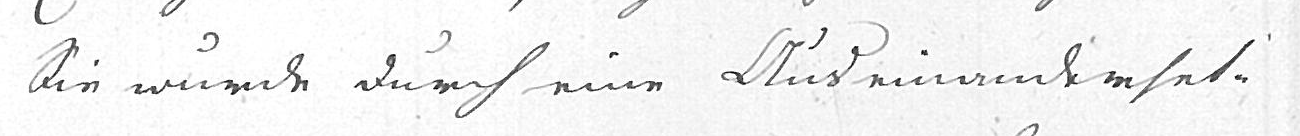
Sie wurde durch eine Auseinanderset-
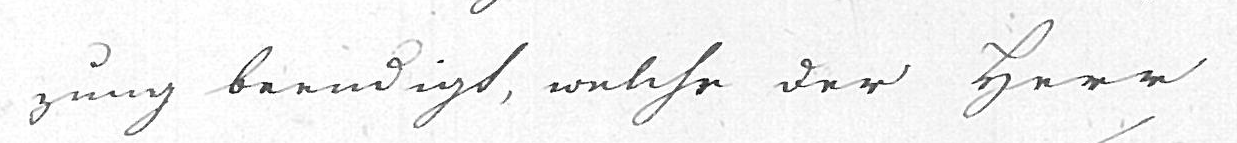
zung beendigt, welche der Herr
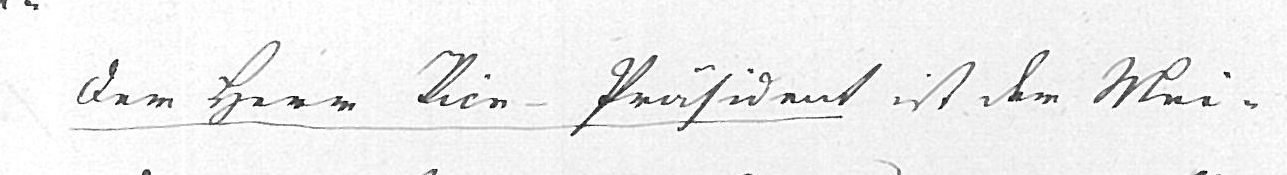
Der Herr Vice-Präsident ist der Mei-
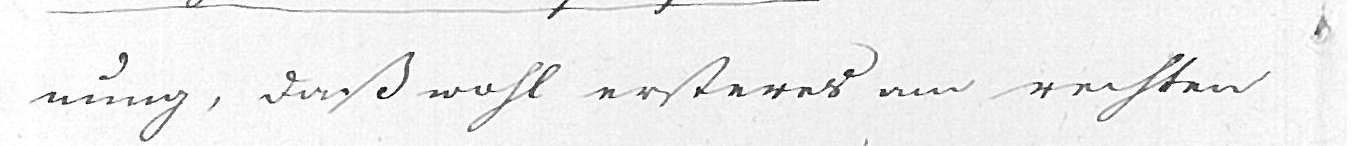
nun, daß wohl ersterers am rechten
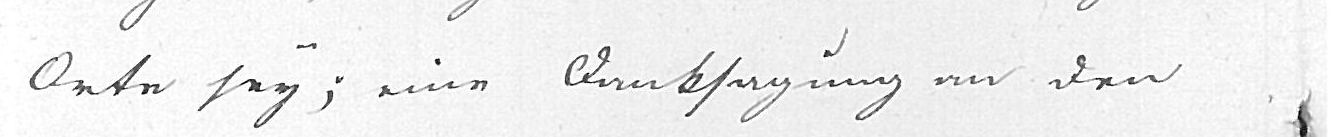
Orte sey; eine Danksagung an den
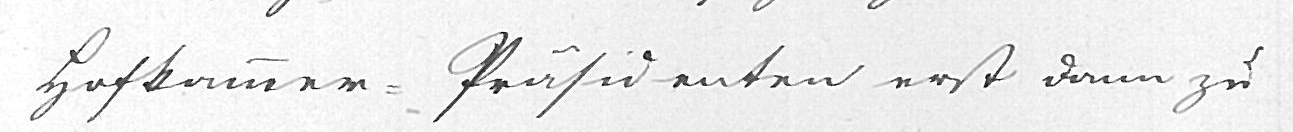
Hofkammer-Präsidenten erst dann zu
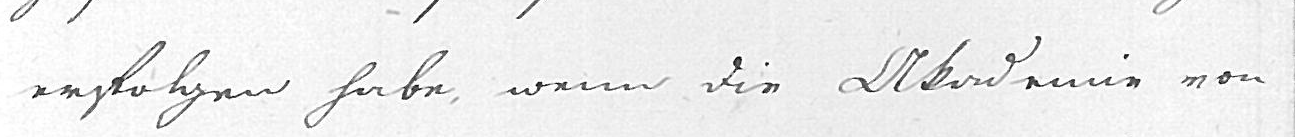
erfolgen habe, wenn die Akademie von
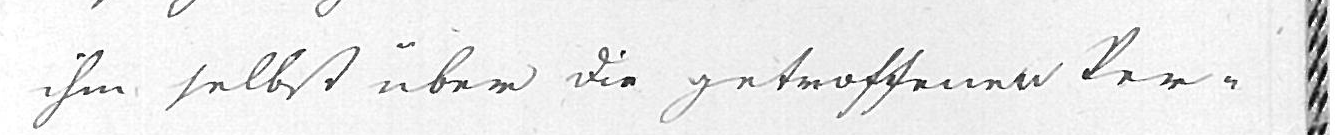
ihm selbst über die getroffenen Ver-
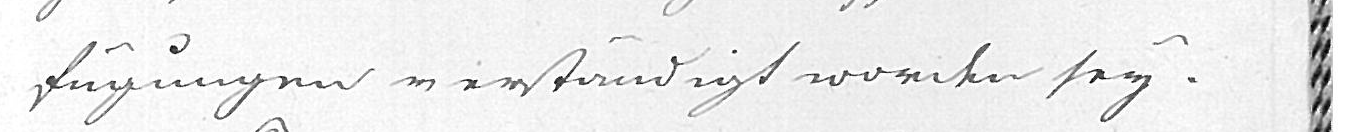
fügungen verständigt worden sey.
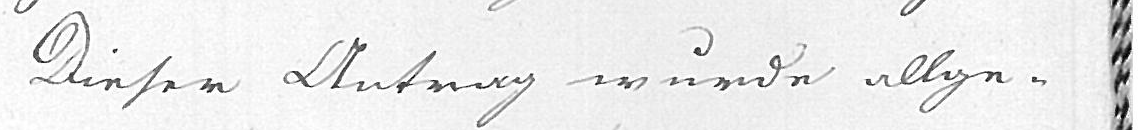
Dieser Antrag wurde allge-
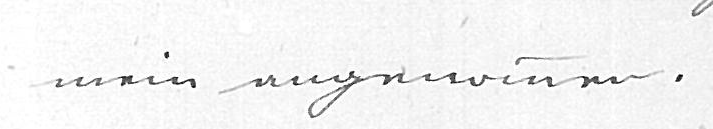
mein angenommen.
